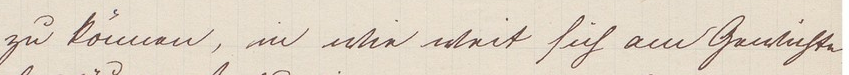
zu können, in wie weit sich am Gewichte
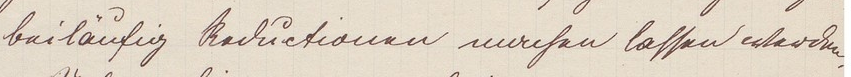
beiläufig Reductionen machen lassen werden.
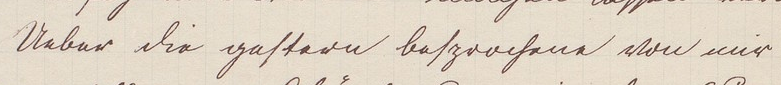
Ueber die gestern besprochene von mir
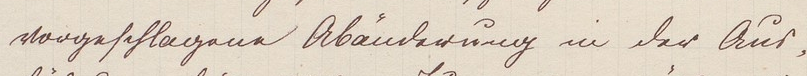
vorgeschlagene Abänderung in der Aus-
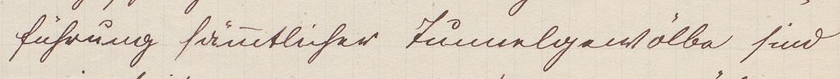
führung sämmtlicher Tunnelgewölbe sind
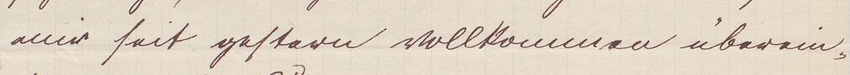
mir seit gestern vollkommen überein-
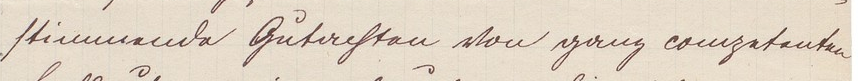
stimmende Gutachten von ganz competenten
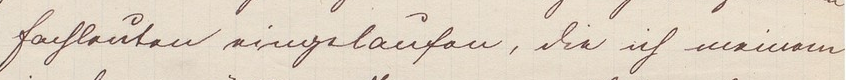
Fachleuten eingelaufen, die ich meinem
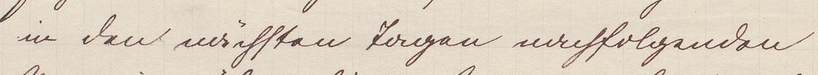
in den nächsten Tagen nachfolgenden
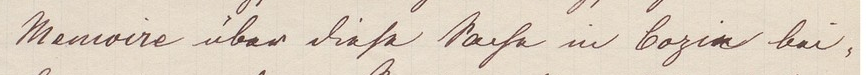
Memoire über diese Sache in Copie bei-
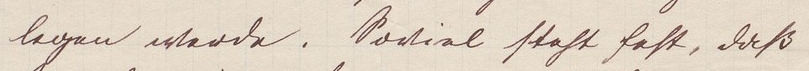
legen werde. Soviel steht fest, daß
